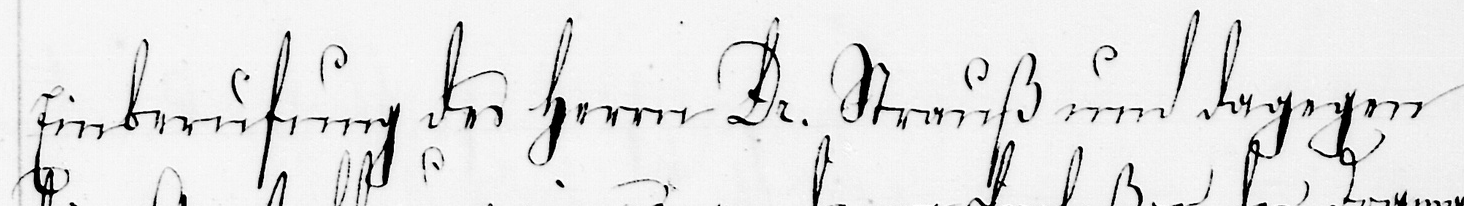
Einberufung des Herrn Dr. Strauß und dagegen
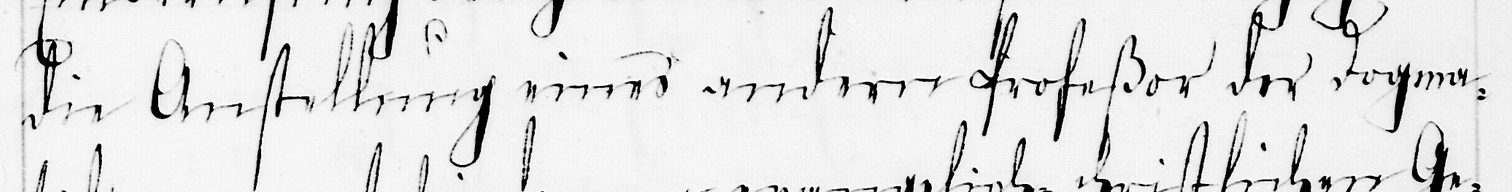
die Anstellung eines andern Profeßor der Dogma¬
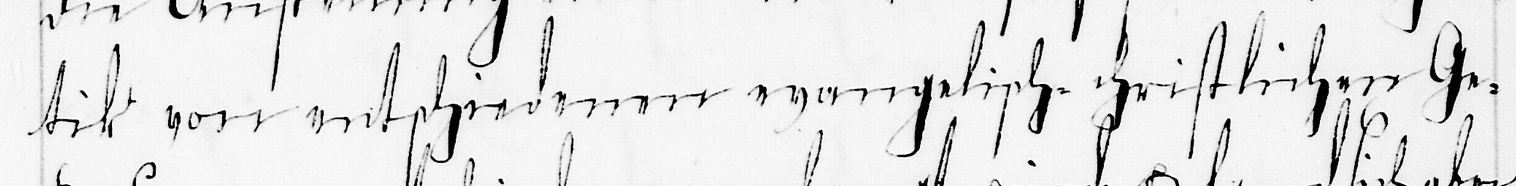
tik von entschiedenen evangelisch-christlichen Ge¬
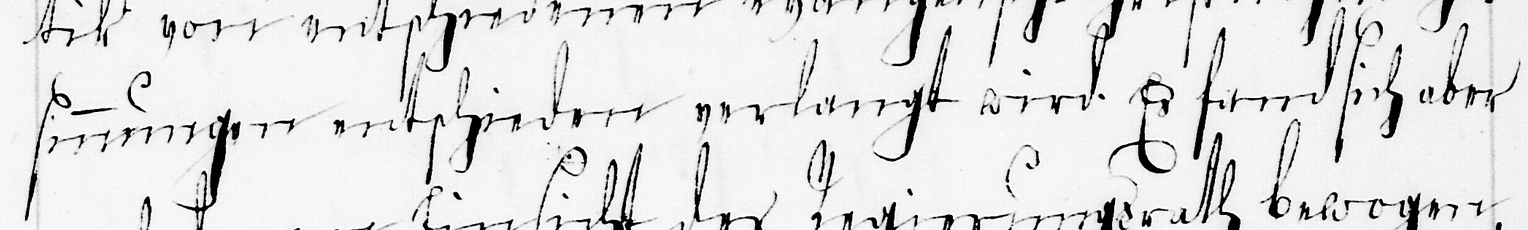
sinnungen entschieden verlangt wird. Es fand sich aber
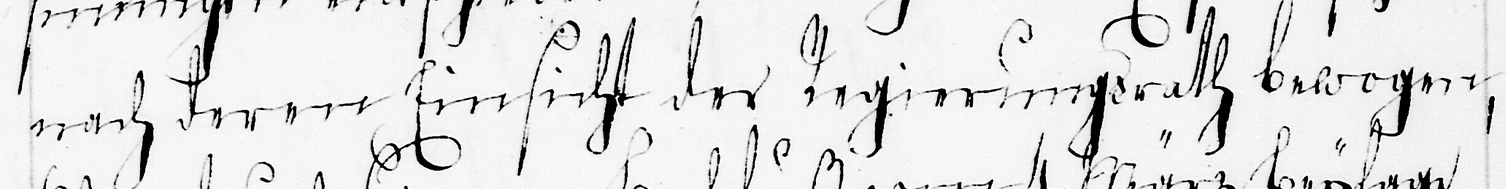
nach deren Einsicht der Regierungsrath bewogen,
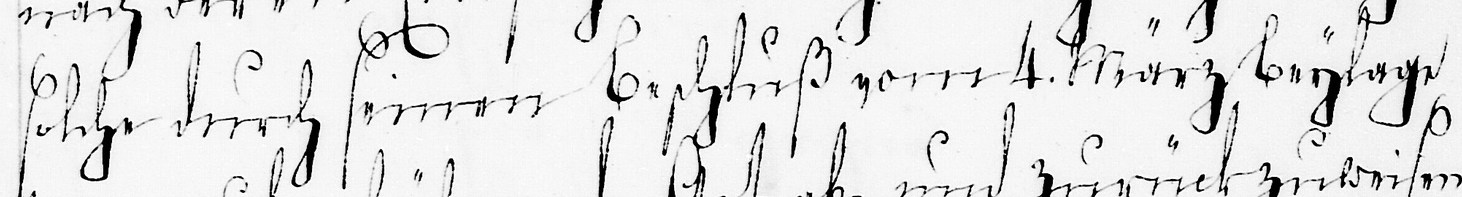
solche durch seinen Beschluß vom 4. März Beylage
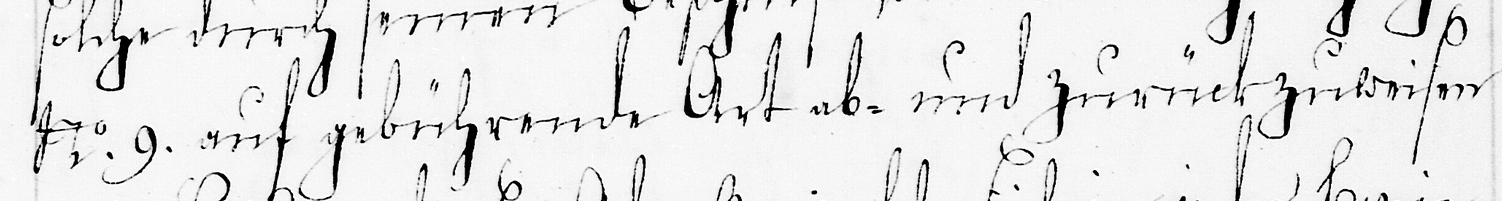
No. 9. auf gebührende Art ab- und zurückzuweisen.
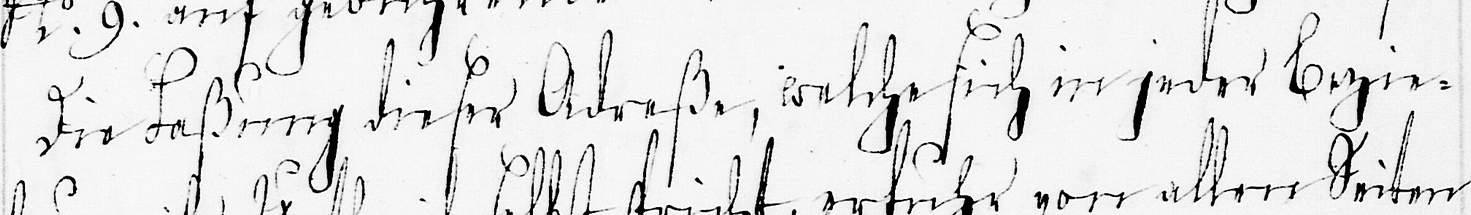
Die Faßung dieser Adreße, welche sich in jeder Bezie¬
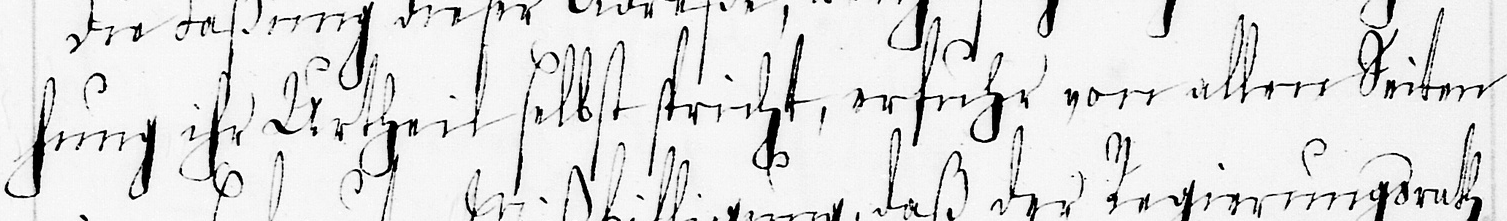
hung ihr Urtheil selbst spricht, erfuhr von allen Seiten
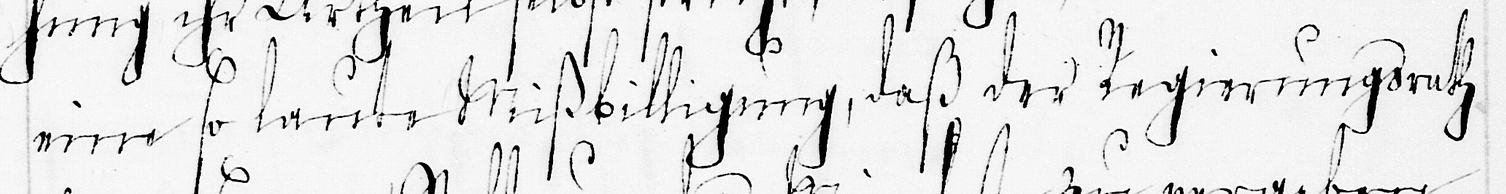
eine so laute Mißbilligung, daß der Regierungsrath
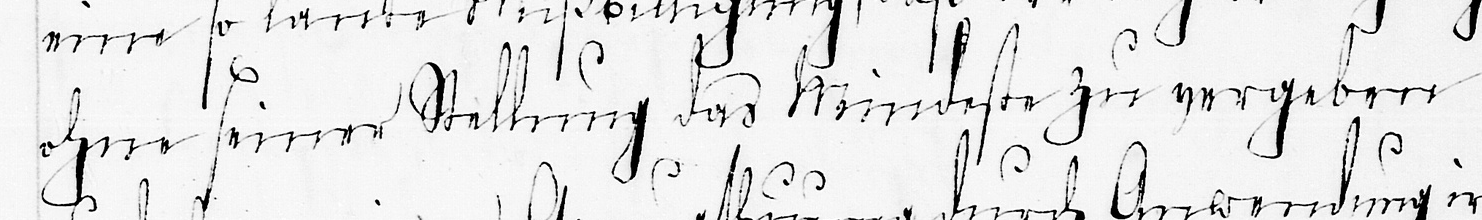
ohne seiner Stellung das Mindeste zu vergeben
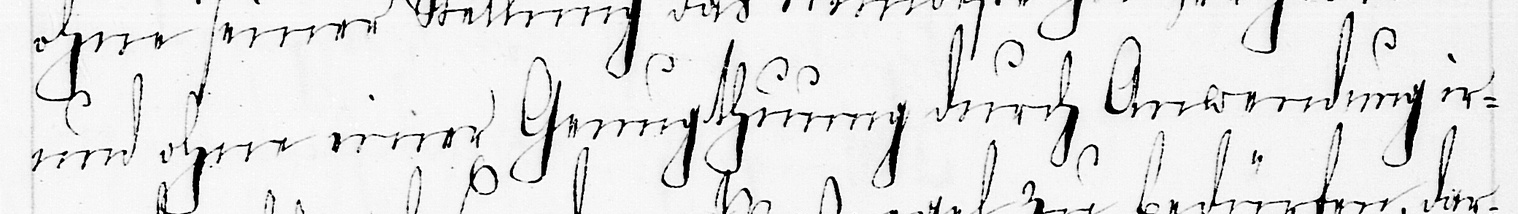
und ohne einer Genugthuung durch Anwendung ir¬
